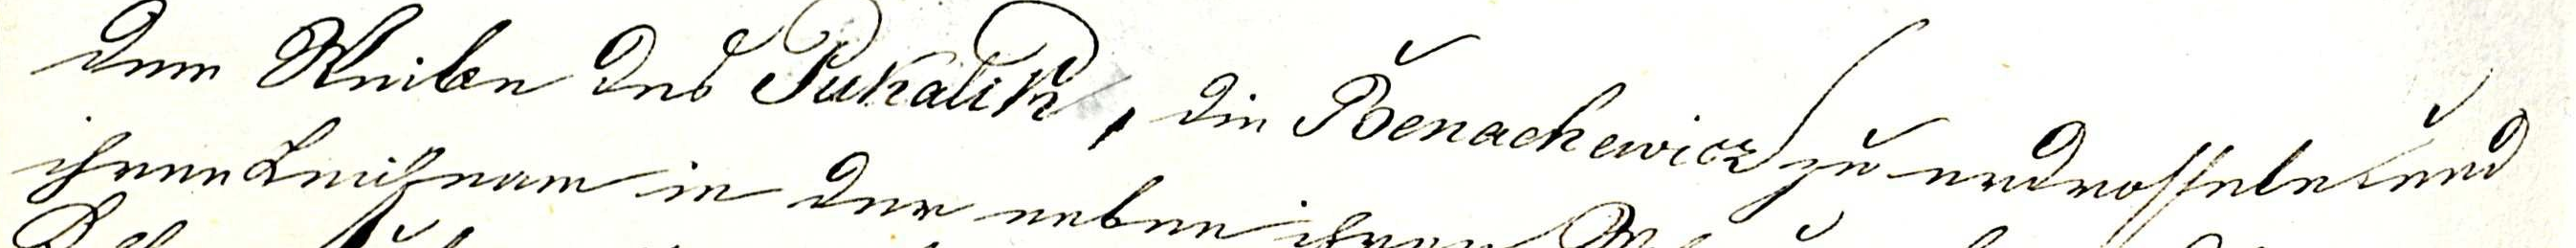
dem Weibe des Pukalik, die Benachewicz zu erdrossele und
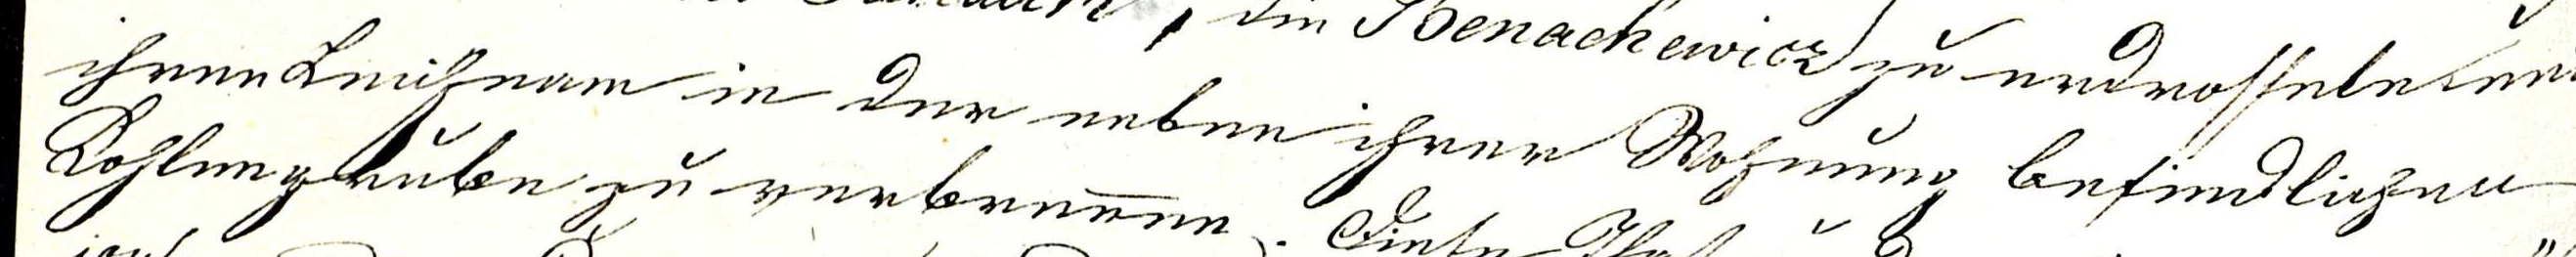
ihren Leichnam in der neben ihrer Wohnung befindlichen
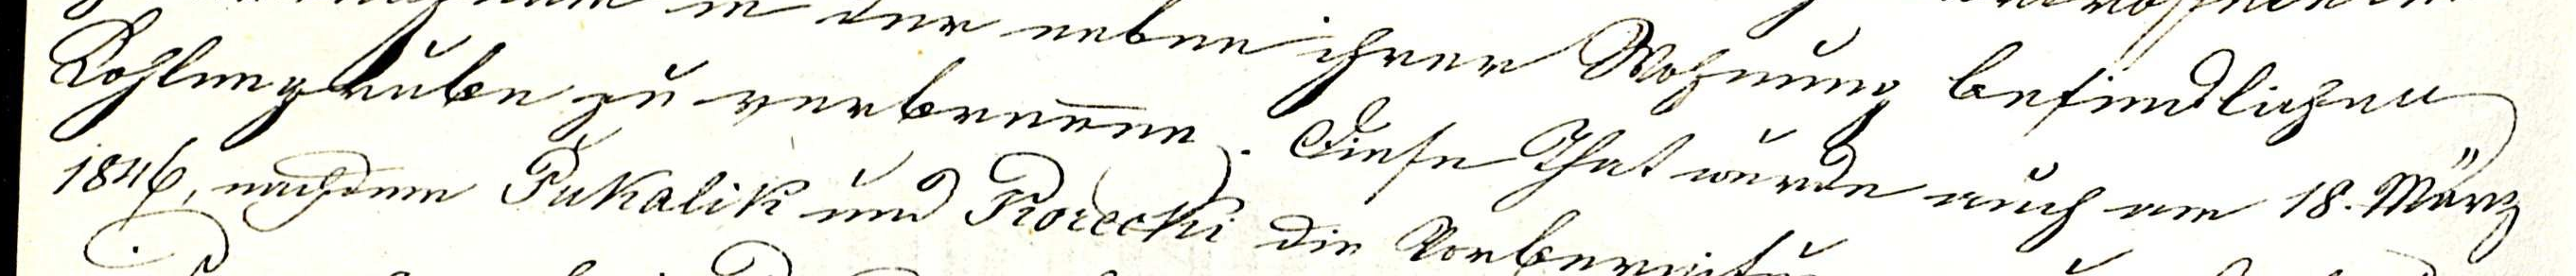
Kohlgrube zu verbrennen. Diese That wurde auch am 18. März
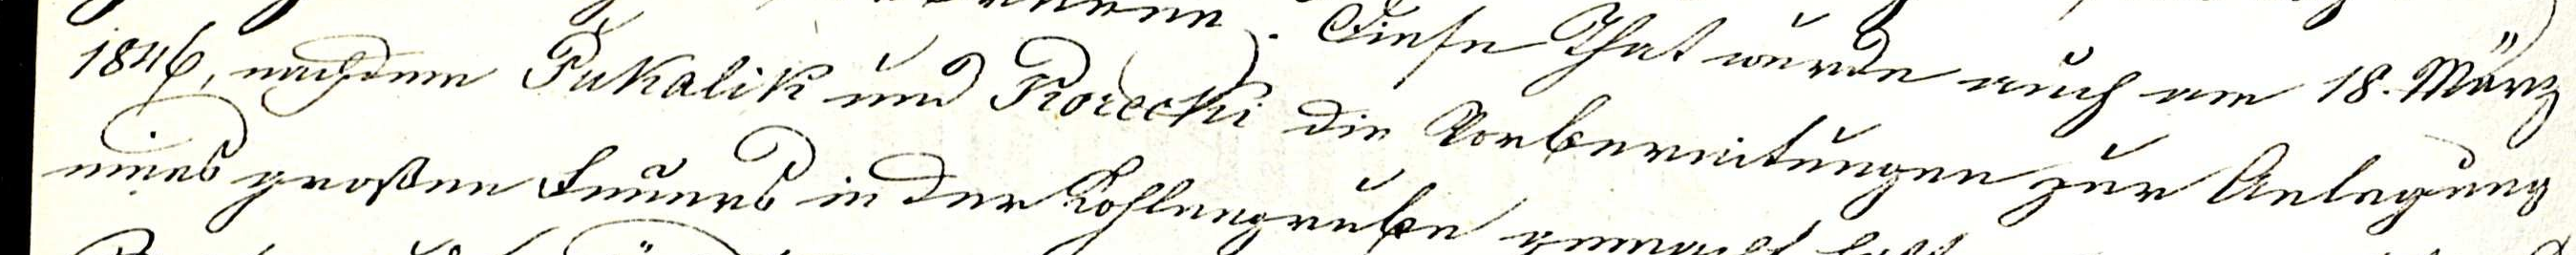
1846, nachdemPukalik und Prorecki die Vorbereitungen zur Anlegung
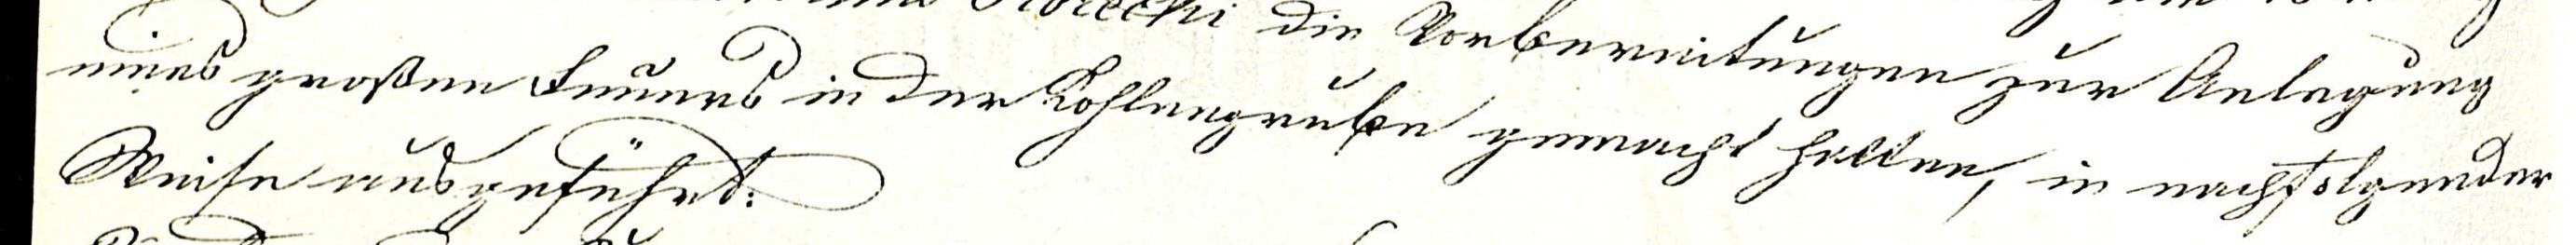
eines großen Feuers in der Kohlengrube gemacht hatten, in nachfolgender
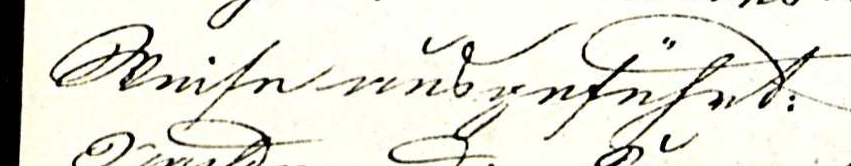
Weise aus geführt:
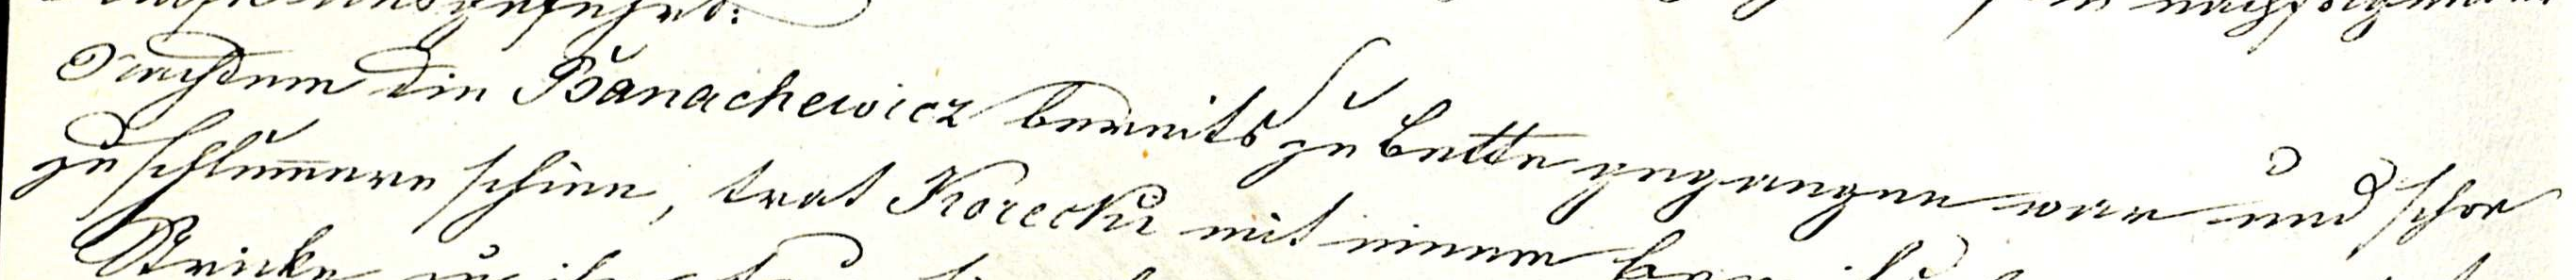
Nachdem die Banachewicz bereits Bette gegangen war und schon
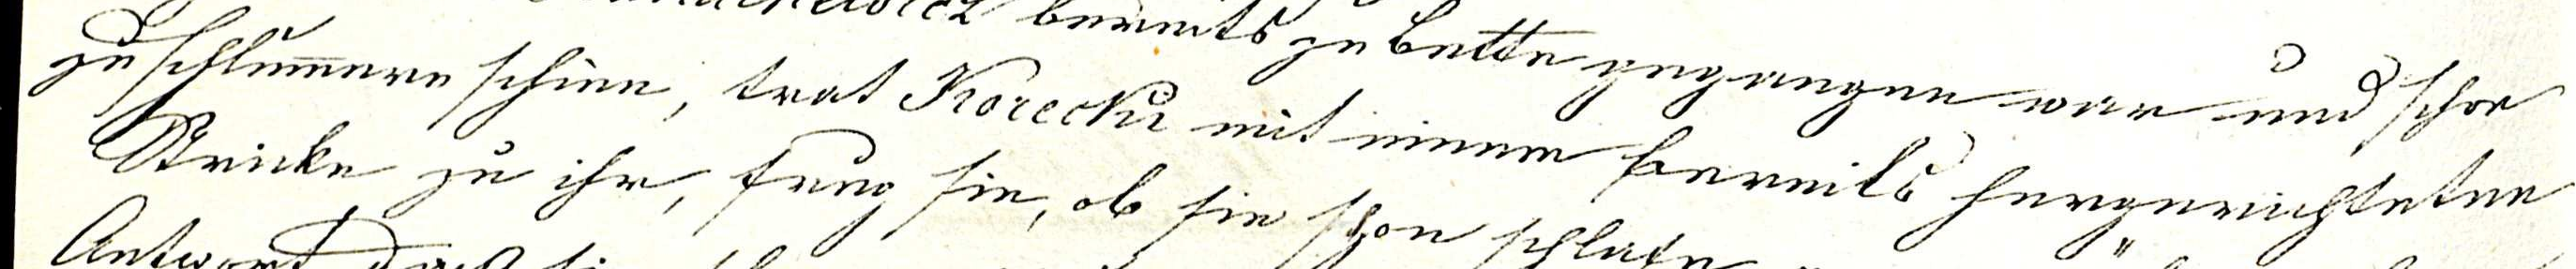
zu schlummere schien, trat Korecki mit einem xxrnils hergerichteten
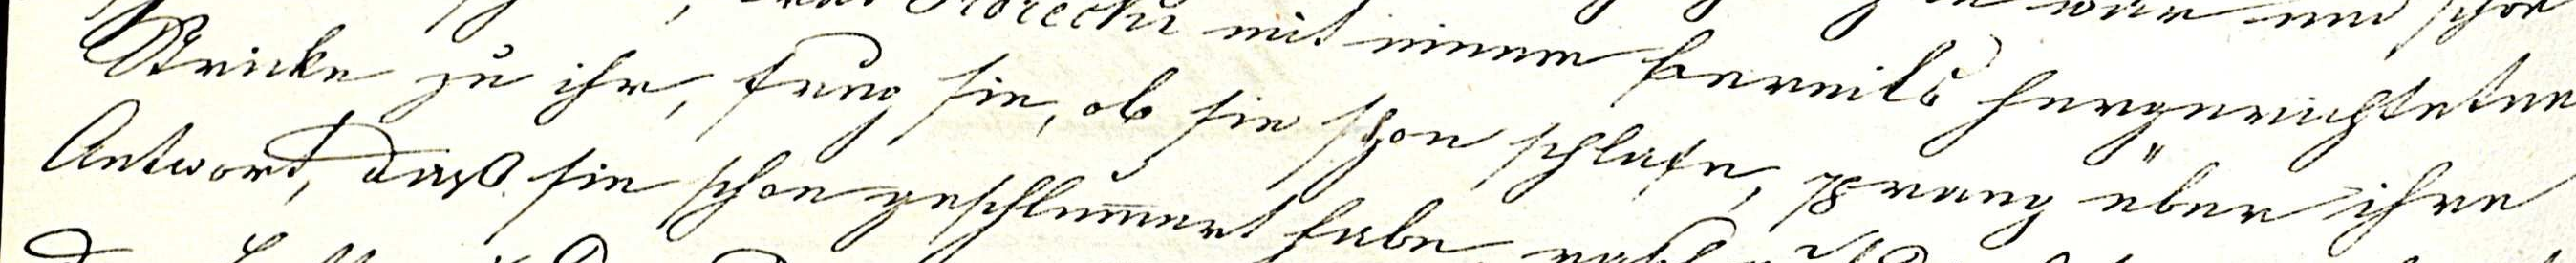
Stricke zu ihr, fung sie, obsinsgon schlefe, preng über ihre
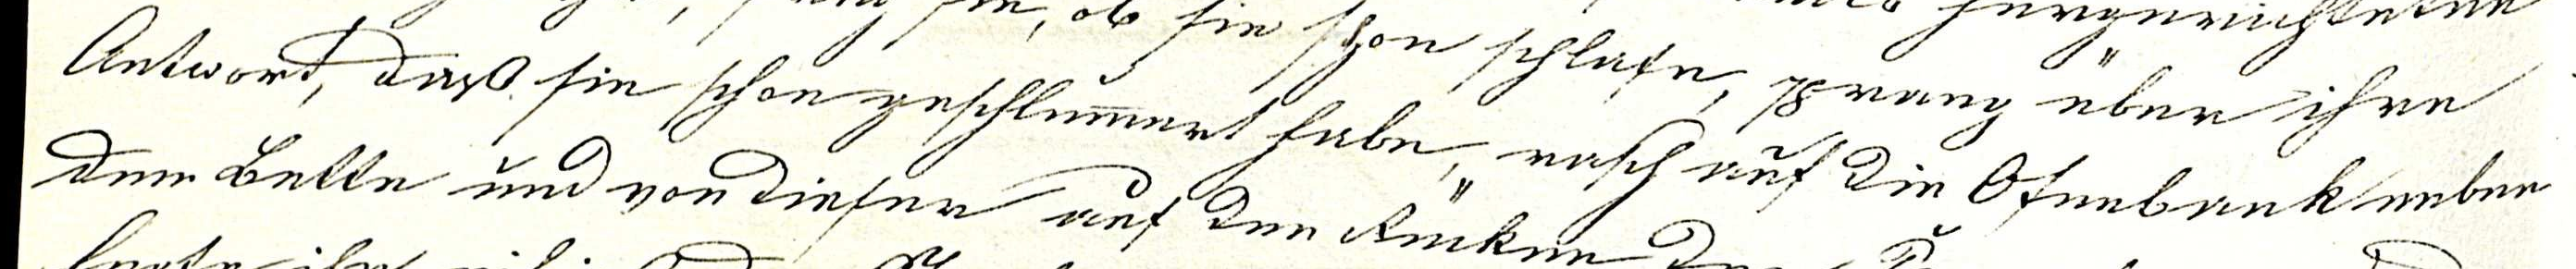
Antwort, daß sie schon geschlummert habe, rasch auf die Ofenbank neben
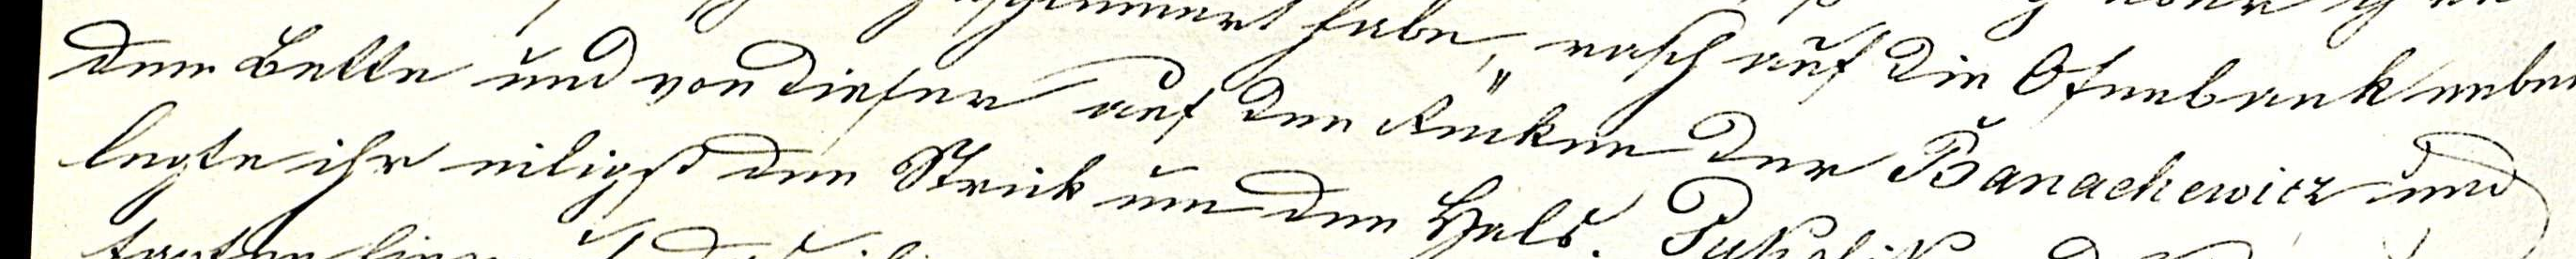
den Bette und von dieser auf den Rücken der Banachewicz und
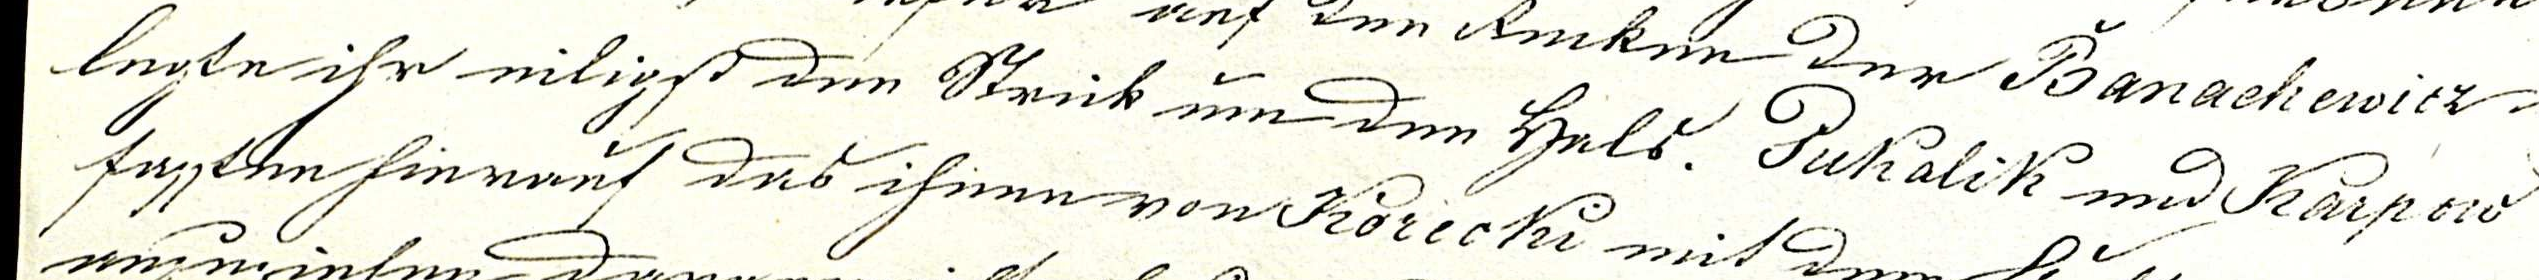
legte ihr eiligst den Strick um den Hals. Pukalik und Karpow
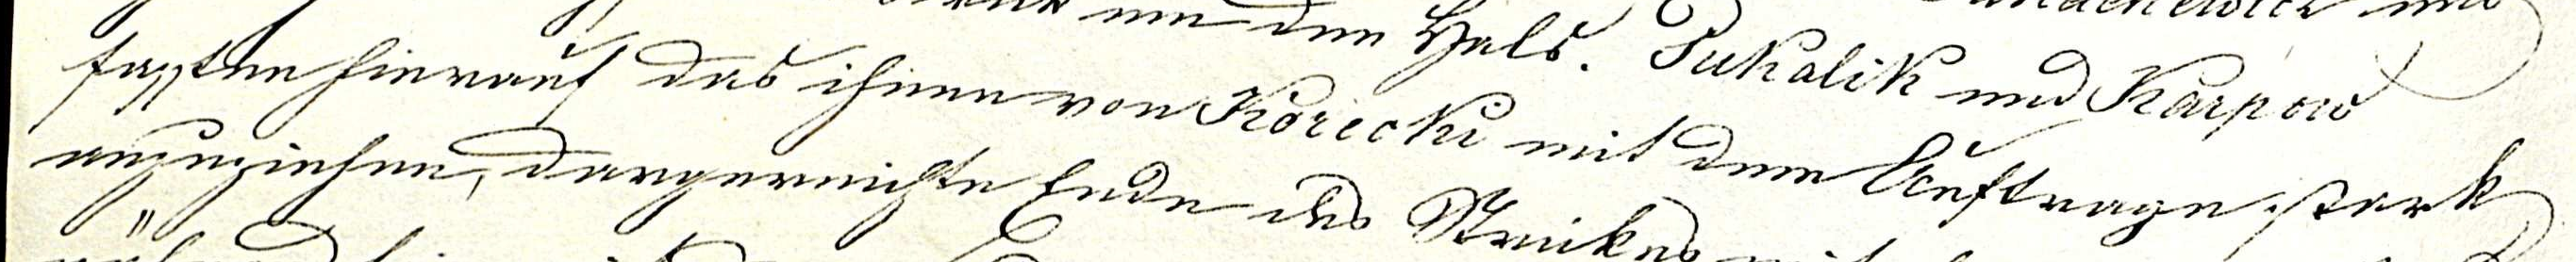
fassten hierauf das ihnen von Korecki mit dem Auftrage stark
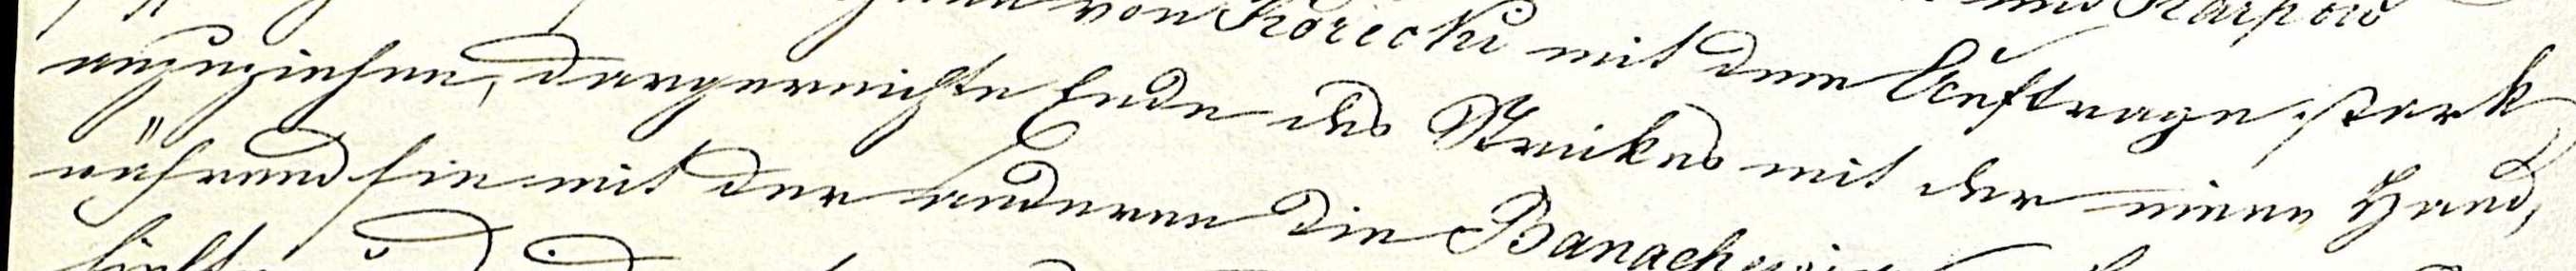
anzuziehen, dargereichte Ende des Streikes mit der einen Hand,
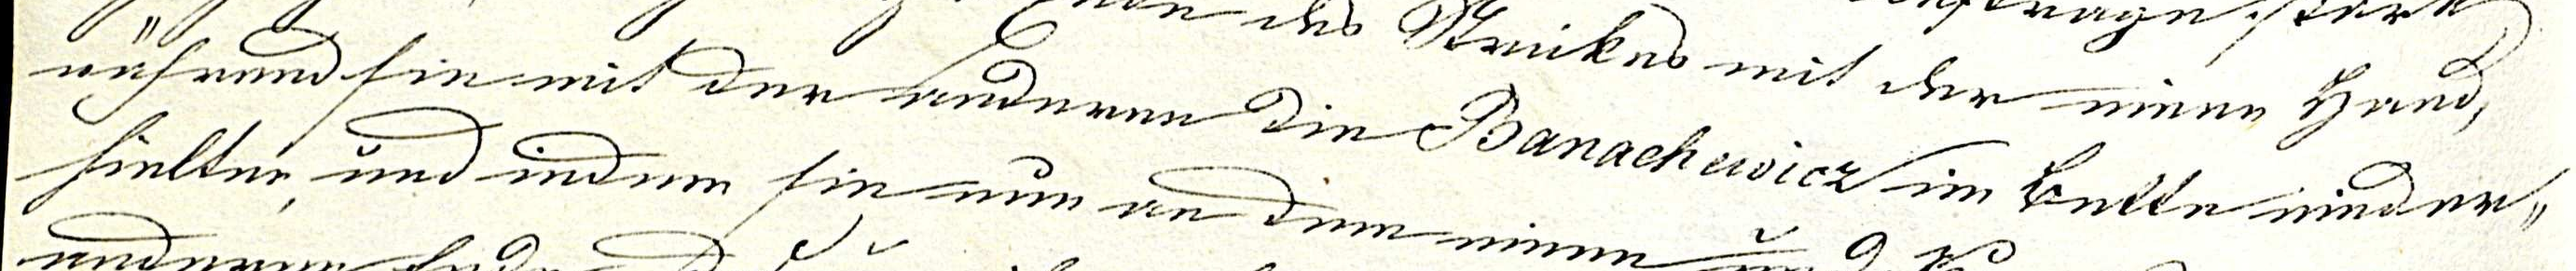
nährend sie mit der anderen die Banchwicz im Bette nieder¬
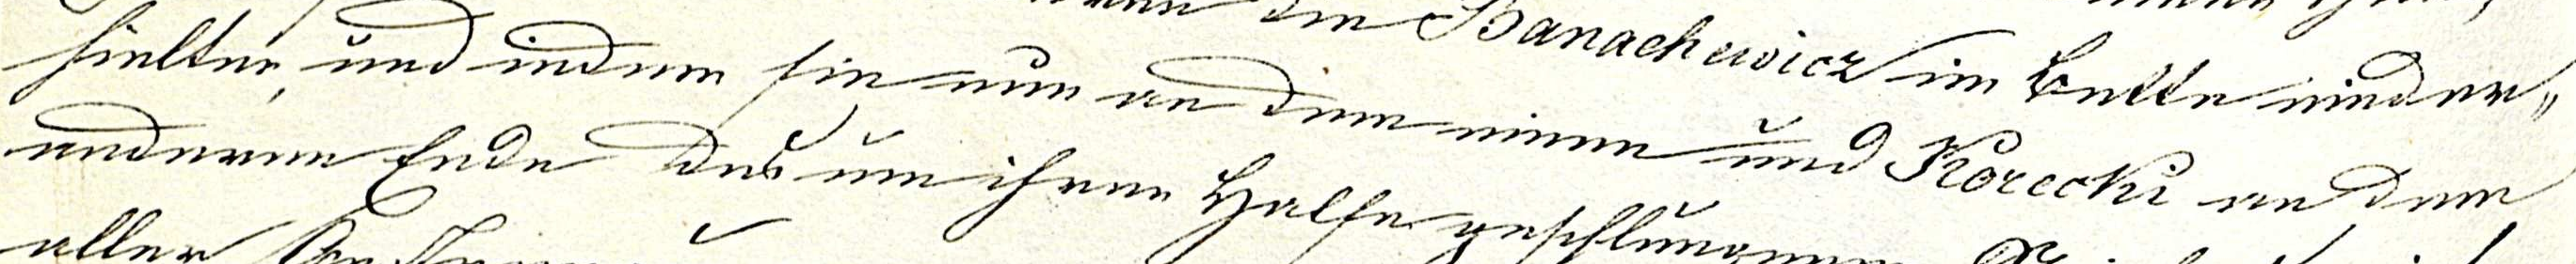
hielten, und indem sie nun an dem einen und Korecki an dem
